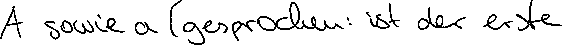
A sowie a (gesprochen: ist der erste
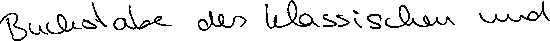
Buchstabe des klassischen und
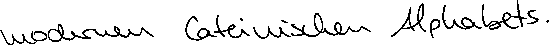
modernen lateinischen Alphabets.
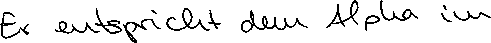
Er entspricht dem Alpha im
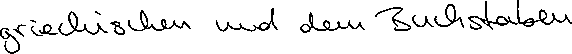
griechischen und dem Buchstaben
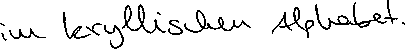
im kyrillischen Alphabet.
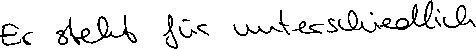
Er steht für unterschiedlich
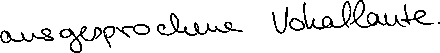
ausgesprochene Vokallaute.
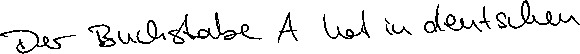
Der Buchstabe A hat in deutschen
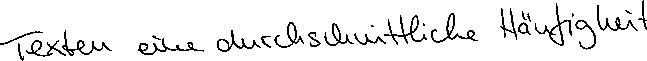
Texten eine durchschnittliche Häufigkeit
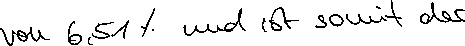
von 6,51 % und ist somit der
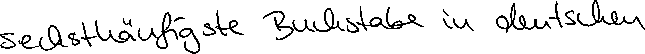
sechsthäufigste Buchstabe in deutschen
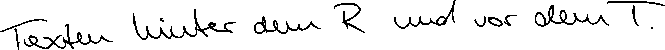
Texten hinter dem R und vor dem T.
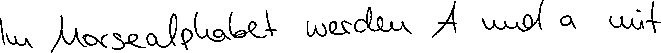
Im Morsealphabet werden A und a mit
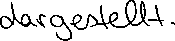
dargestellt.
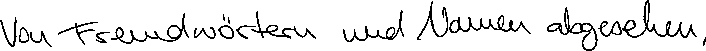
Von Fremdwörtern und Namen abgesehen,
